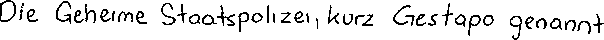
Die Geheime Staatspolizei, kurz Gestapo genannt
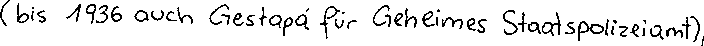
(bis 1936 auch Gestapa für Geheimes Staatspolizeiamt),
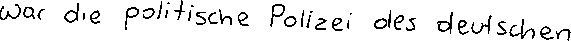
war die politische Polizei des deutschen
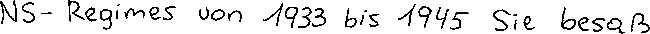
NS-Regimes von 1933 bis 1945. Sie besaß
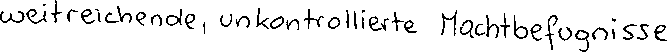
weitreichende, unkontrollierte Machtbefugnisse
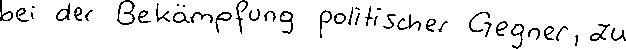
bei der Bekämpfung politischer Gegner, zu
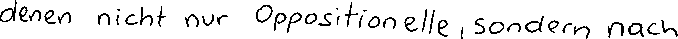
denen nicht nur Oppositionelle, sondern nach
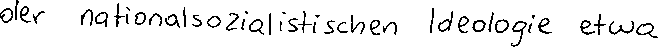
der nationalsozialistischen Ideologie etwa
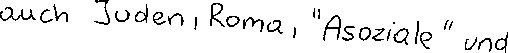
auch Juden, Roma, "Asoziale" und
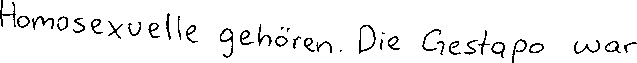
Homosexuelle gehörten. Die Gestapo war
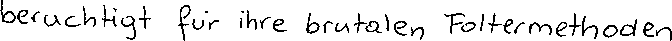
berüchtigt für ihre brutalen Foltermethoden
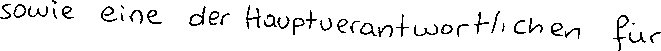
sowie eine der Hauptverantwortlichen für
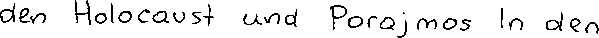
den Holocaust und Porajmos. In den
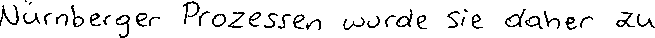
Nürnberger Prozessen wurde sie daher zu
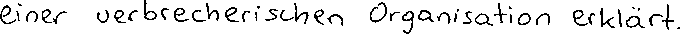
einer verbrecherischen Organisation erklärt.
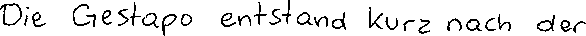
Die Gestapo entstand kurz nach der
